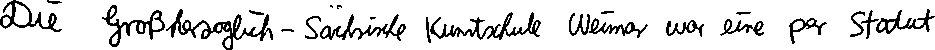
Die Großherzoglich-Sächsische Kunstschule Weimar war eine per Statut
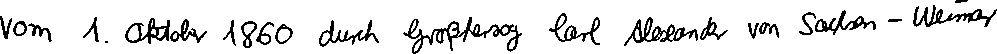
vom 1. Oktober 1860 durch Großherzog Carl Alexander von Sachsen-Weimar
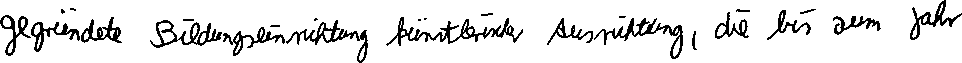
gegründete Bildungseinrichtung künstlerischer Ausrichtung, die bis zum Jahr
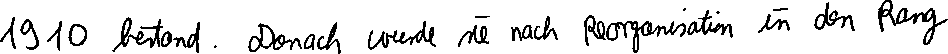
1910 bestand. Danach wurde sie nach Reorganisation in den Rang
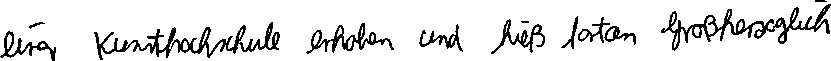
einer Kunsthochschule erhoben und hieß fortan Großherzoglich
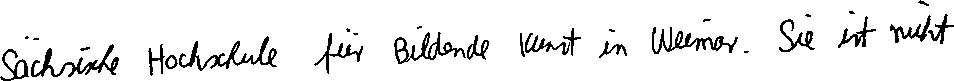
Sächsische Hochschule für Bildende Kunst in Weimar. Sie ist nicht
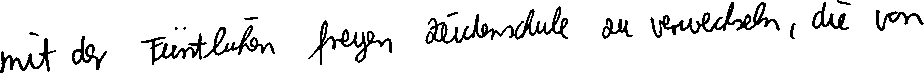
mit der Fürstlichen freyen Zeichenschule zu verwechseln, die von
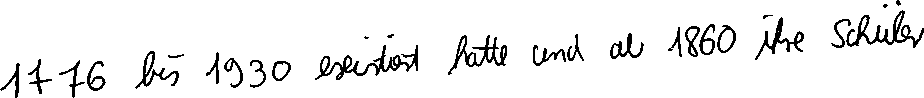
1776 bis 1930 existiert hatte und ab 1860 ihre Schüler
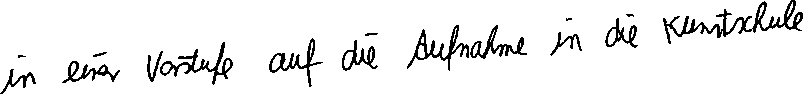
in einer Vorstufe auf die Aufnahme in die Kunstschule
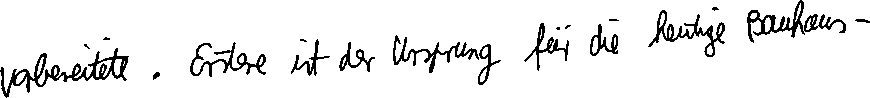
vorbereitete. Erstere ist der Ursprung für die heutige Bauhaus-
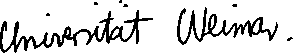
Universität Weimar.
